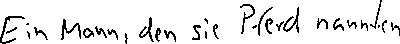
Ein Mann, den sie Pferd nannten
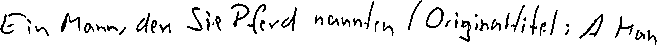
Ein Mann, den sie Pferd nannten (Originaltitel: A Man
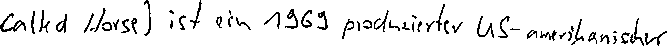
Called Horse) ist ein 1969 produzierter US-amerikanischer
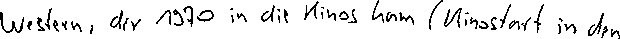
Western, der 1970 in die Kinos kam (Kinostart in den
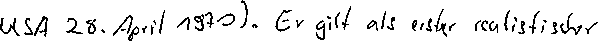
USA 28. April 1970). Er gilt als erster realistischer
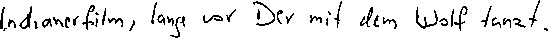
Indianerfilm, lange vor Der mit dem Wolf tanzt.
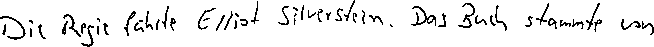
Die Regie führte Elliot Silverstein. Das Buch stammte von
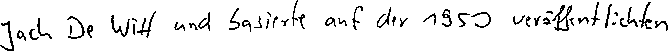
Jack De Witt und basierte auf der 1950 veröffentlichten
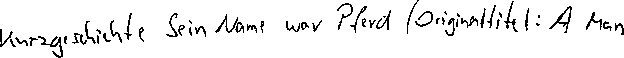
Kurzgeschichte Sein Name war Pferd (Originaltitel: A Man
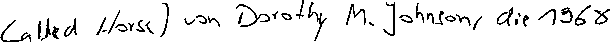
Called Horse) von Dorothy M. Johnson, die 1968
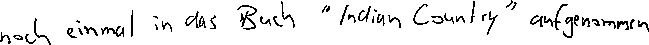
noch einmal in das Buch "Indian Country" aufgenommen
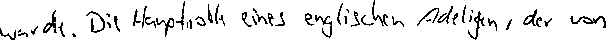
wurde. Die Hauptrolle eines englischen Adeligen, der von
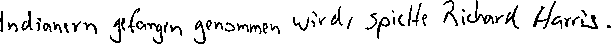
Indianern gefangen genommen wird, spielte Richard Harris.
